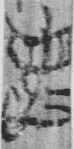若
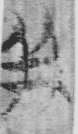并
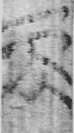天
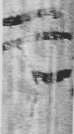下
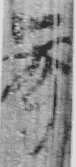而
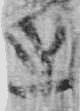之
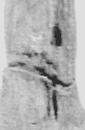肘（守）
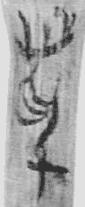○（一）
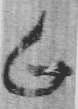㠯（以）
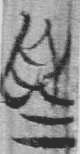爲
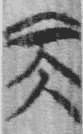天
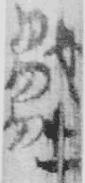○（地）
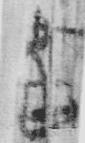旨
